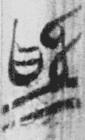爲
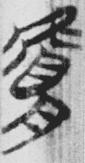膚
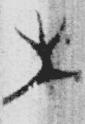木
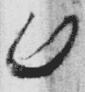㠯（以）
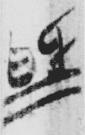爲
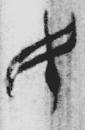民
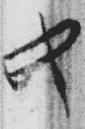女（如）
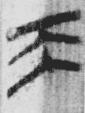天
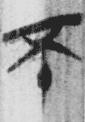不
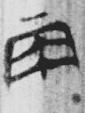雨
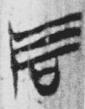石
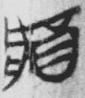𨟻（將）
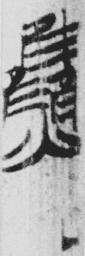焦
